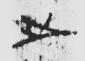之
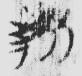新
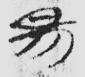昜（陽）
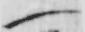一
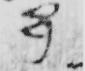邑
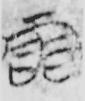霝（靈）
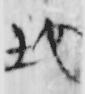地
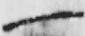一
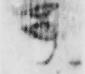邑
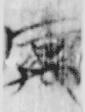厲
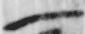一
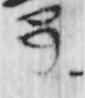邑
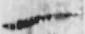一
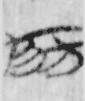房
